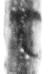六
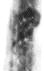日
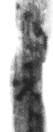九
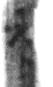月
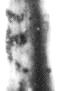內（入）
